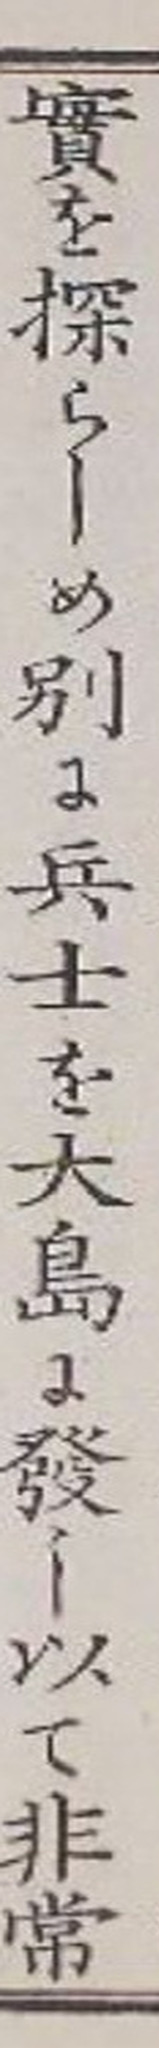実を探らしめ別に兵士を大島に発し以て非常
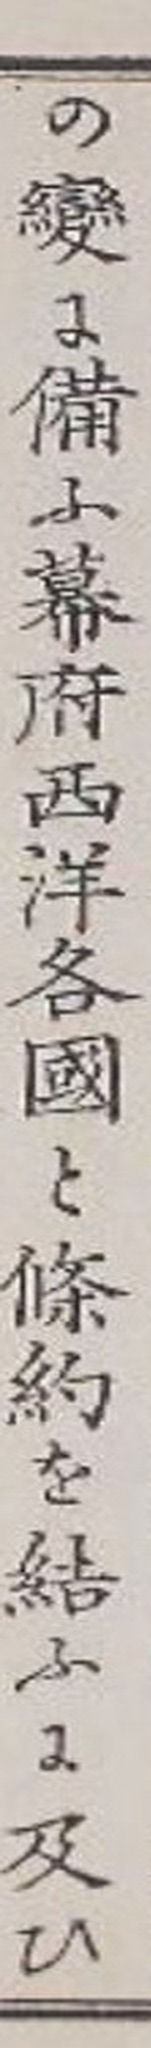の変に備ふ幕府西洋各国と条約を結ふに及ひ
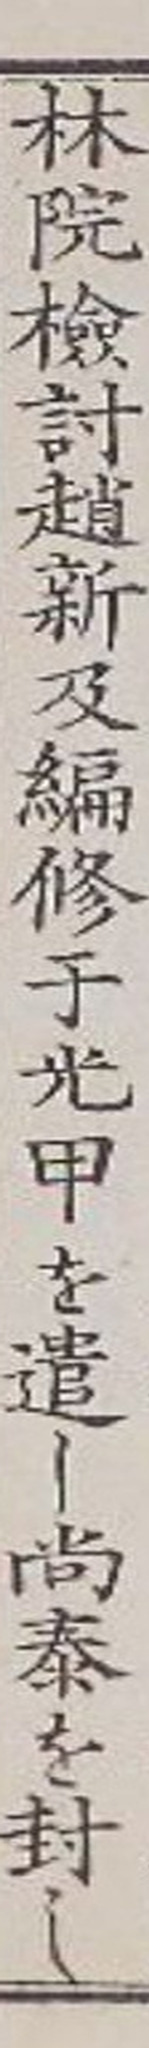林院検討趙新及編修子光甲を遣し尚泰を封し
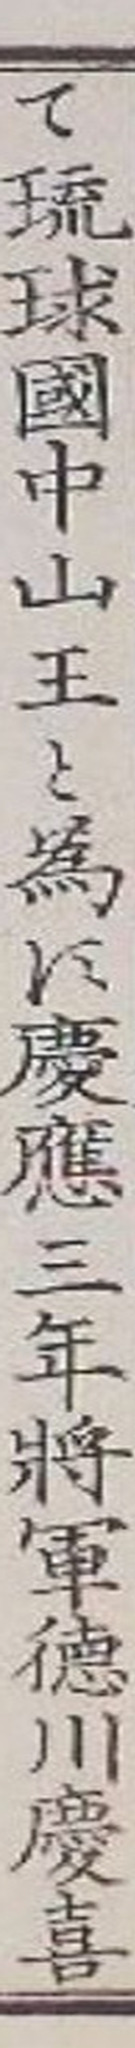て琉球国中山王と為す慶応三年将軍徳川慶喜
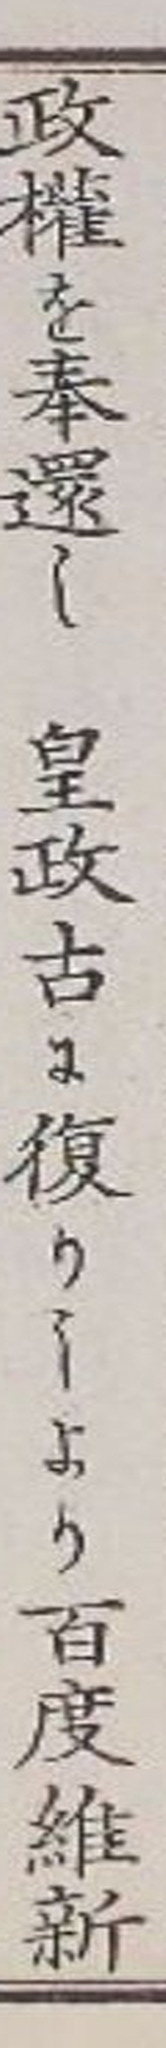政権を奉還し皇政古に復りしより百度維新
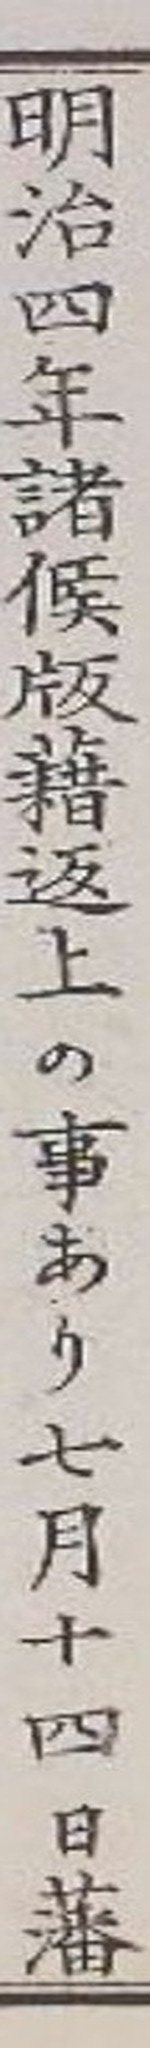明治四年諸侯版籍返上の事あり七月十四日藩
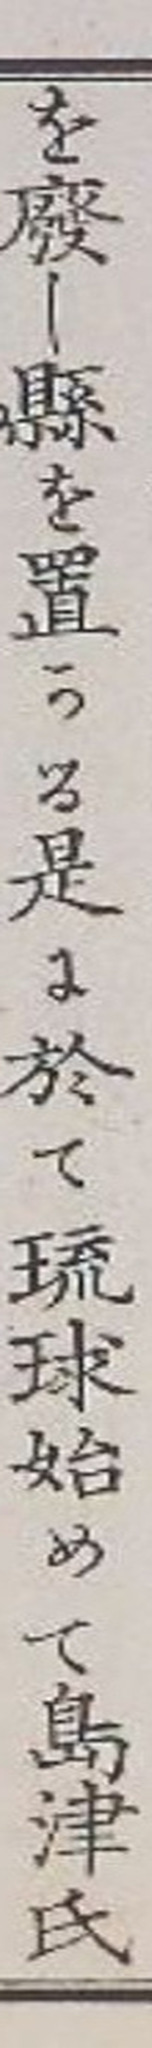を廃し県を置かる是に於て琉球始めて島津氏
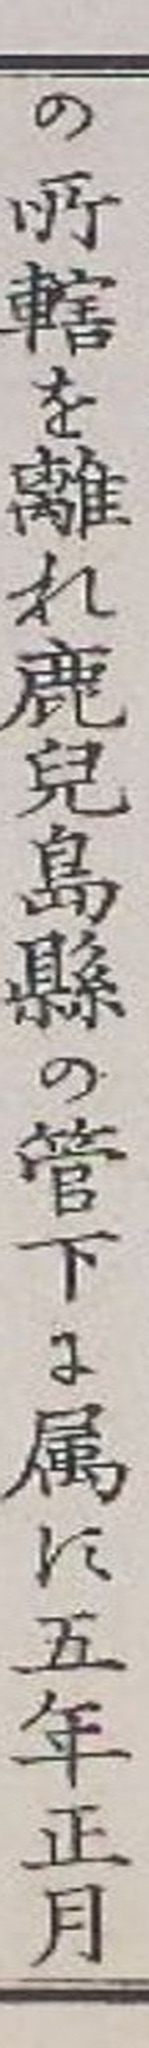の所轄を離れ鹿児島県の管下に属す五年正月
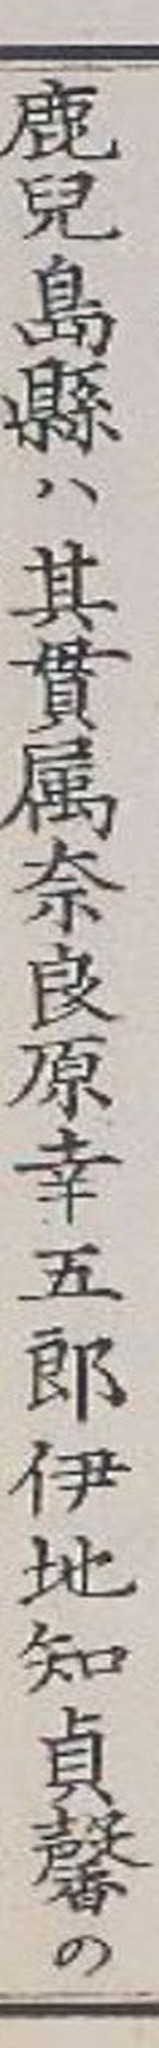鹿児島県は其貫属奈良原幸五郎伊地知貞馨の
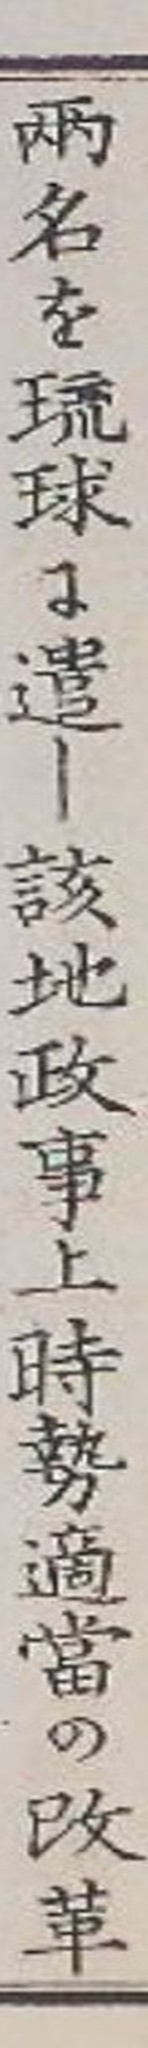良名を琉球に遣し該地政事上時勢適当の改革
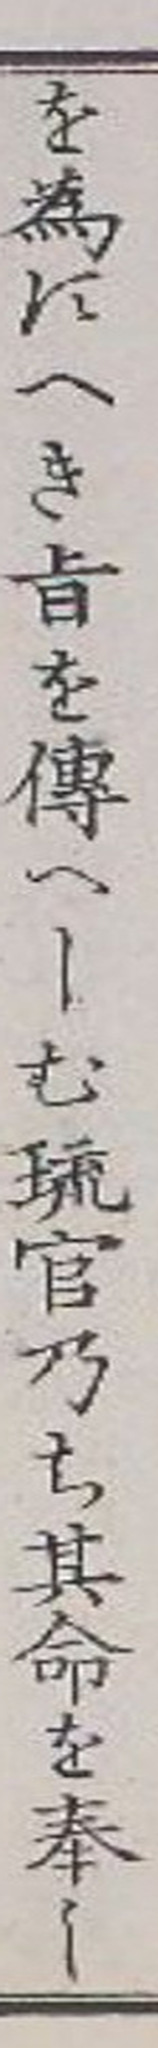を為すへき旨を伝えしむ琉官乃ち其命を奉し
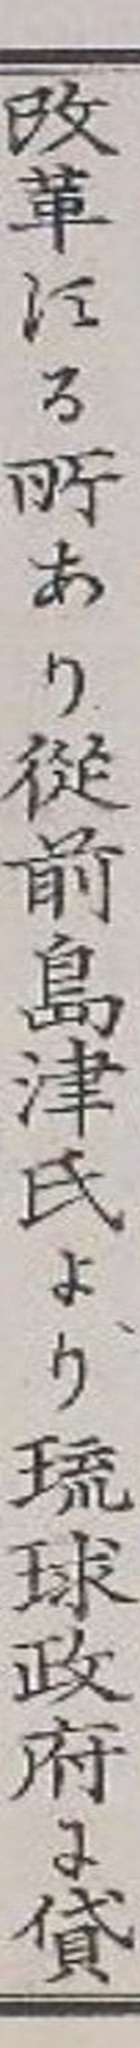政革する所あり従前島津氏より琉球政府に貸
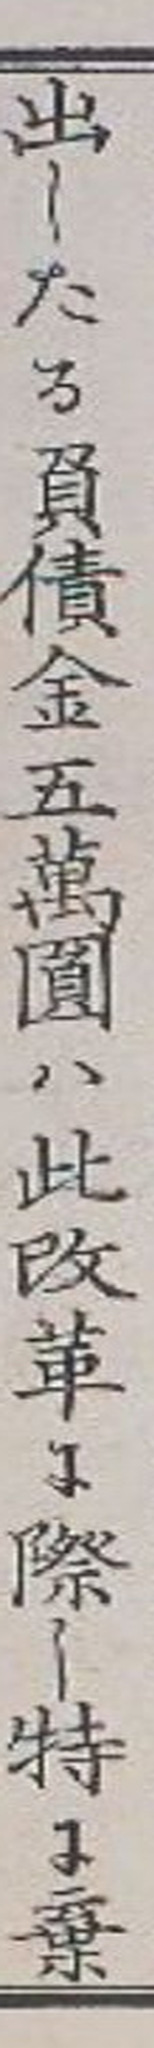出したる負債金五万円は此改革に際し特に棄

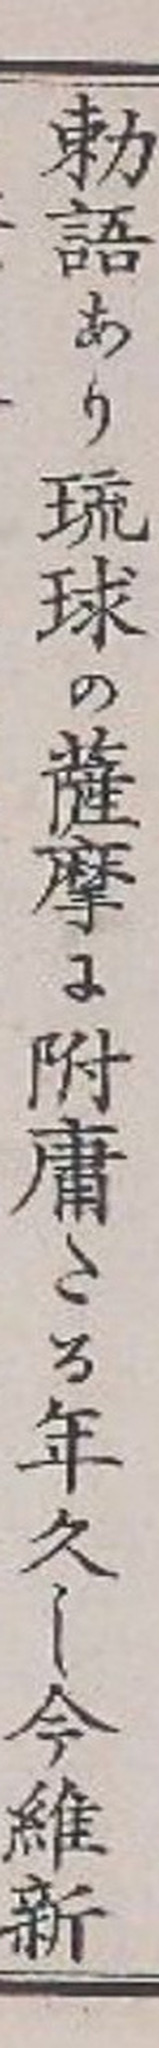勅語あり琉球の薩摩に付庸たる年久し今維新
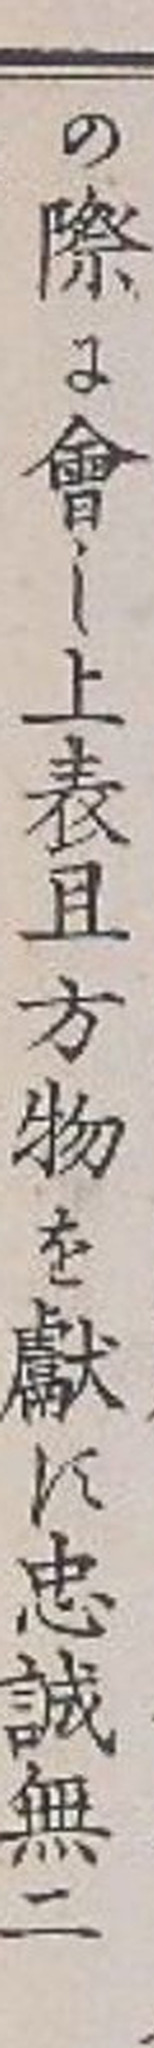の際に会し上表且方物を献す忠誠無二
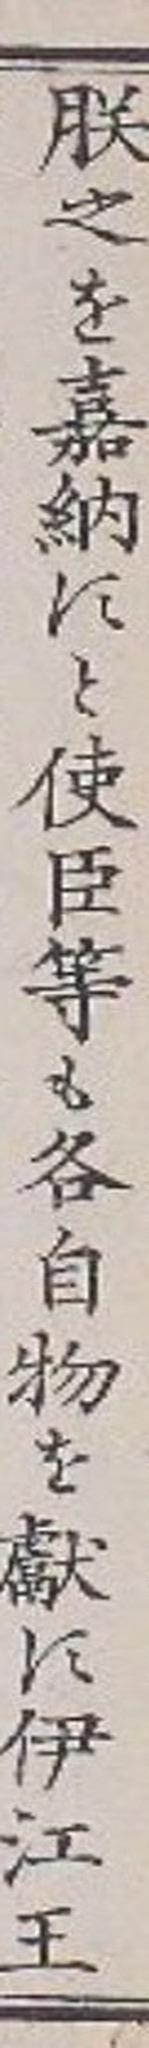朕之を嘉納すと使臣等も各自物を献す伊江王
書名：南島紀事 下
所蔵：University of the Ryukyus Library
